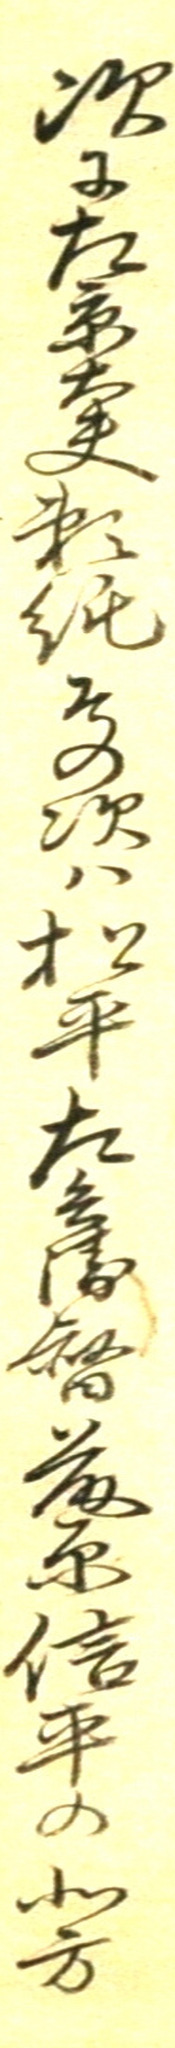次に左京大夫頼純その次は松平左兵衛督藤原信平の北方
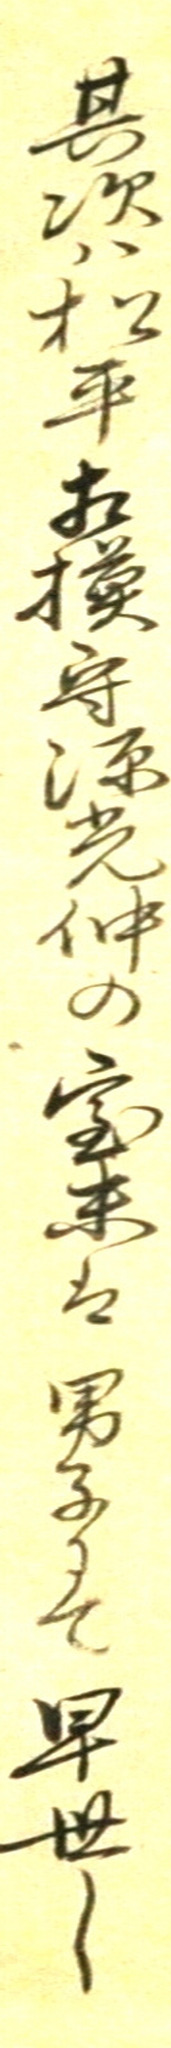其次は松平相模守源光仲の室末は男子にて早世し
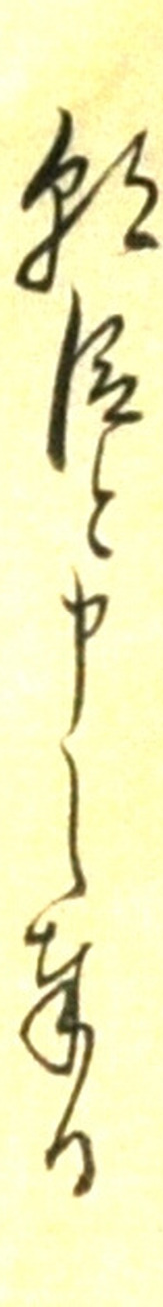朝臣と申し奉る
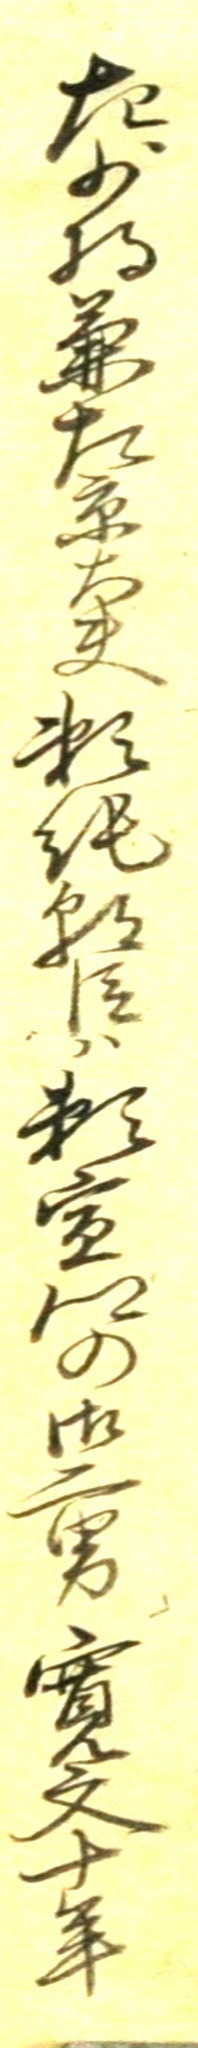左少将兼左京大夫頼純朝臣は頼宣卿の御二男寛文十年

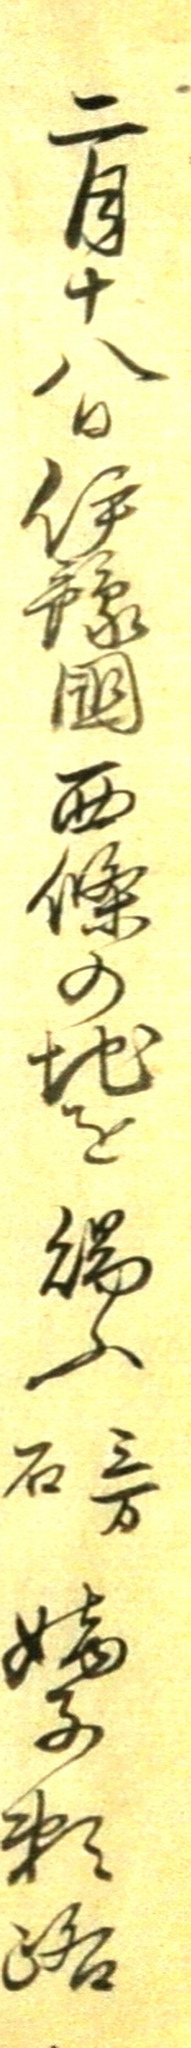二月十八日伊予国西条の地を賜ふ三万石嫡子頼路
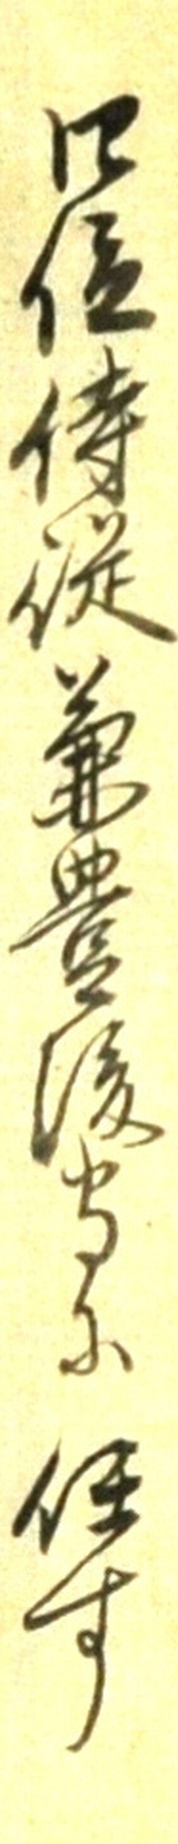四位侍従兼豊後守に任す
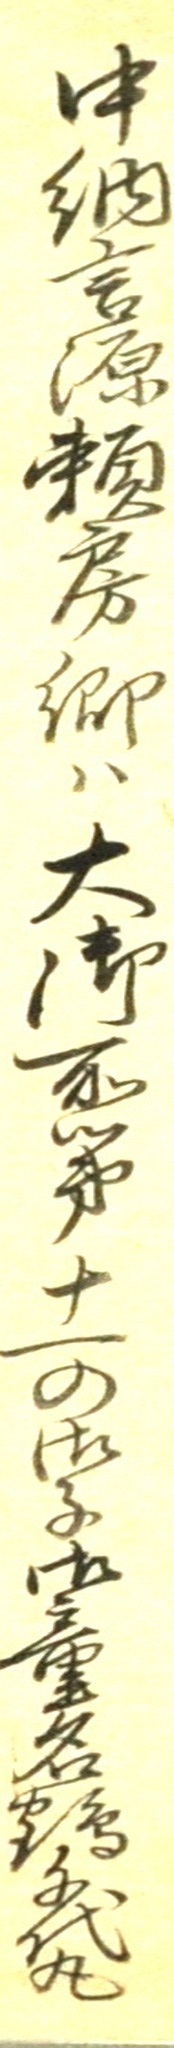中納言源房卿は大御所第十一の御子御童名鶴千代丸
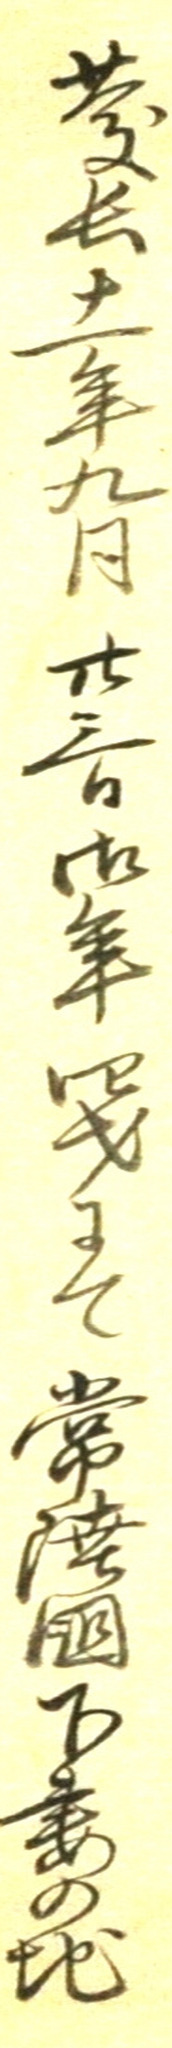慶長十一年九月廿三日御年四才にて常陸国下妻の地
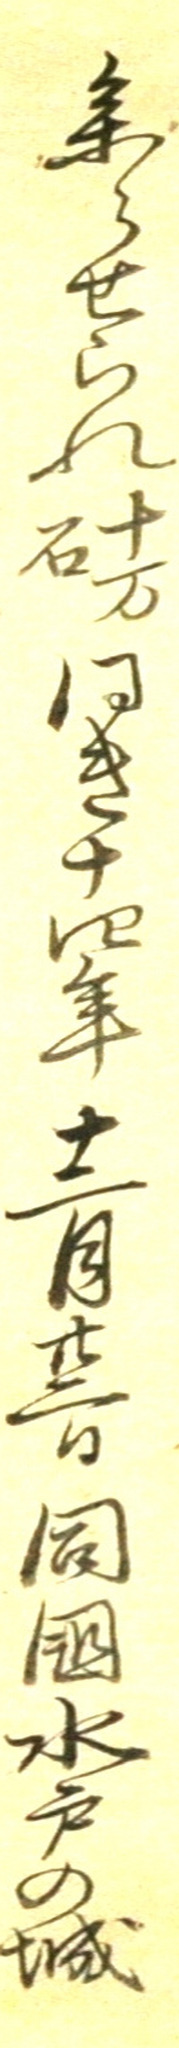参らせられ十万石同き十四年十二月廿二日同国水戸の城
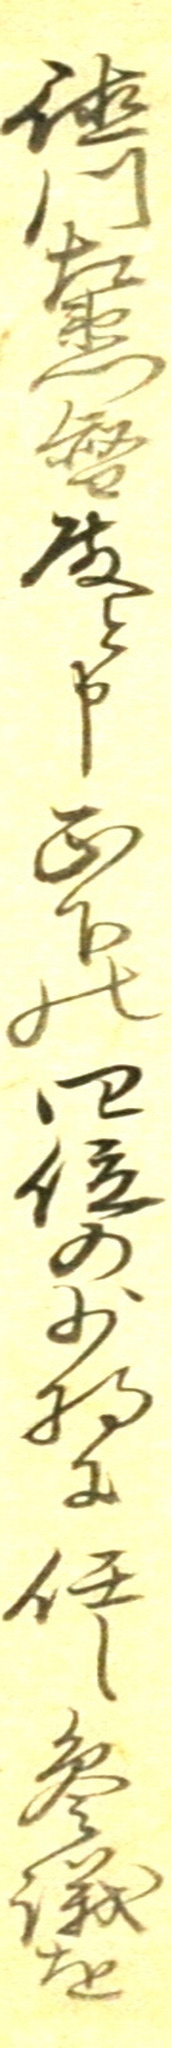徳川左衛門督と申正下の四位の少将に任し参議を
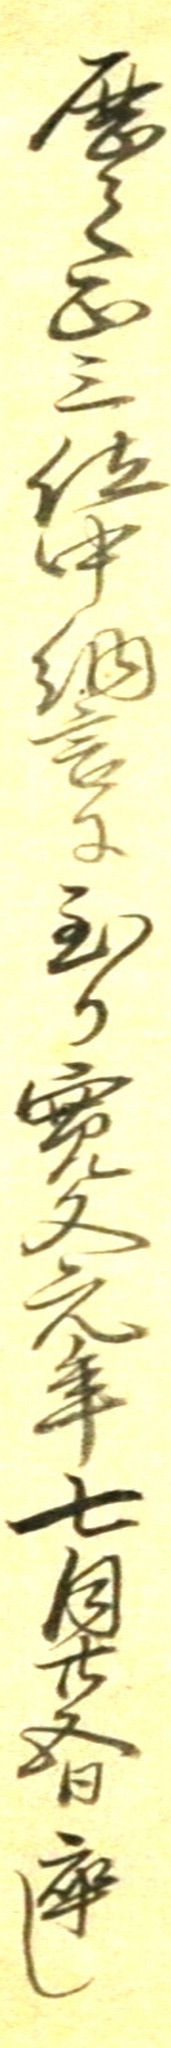歴て正三位中納言に至り寛文元年七月廿五日卒し
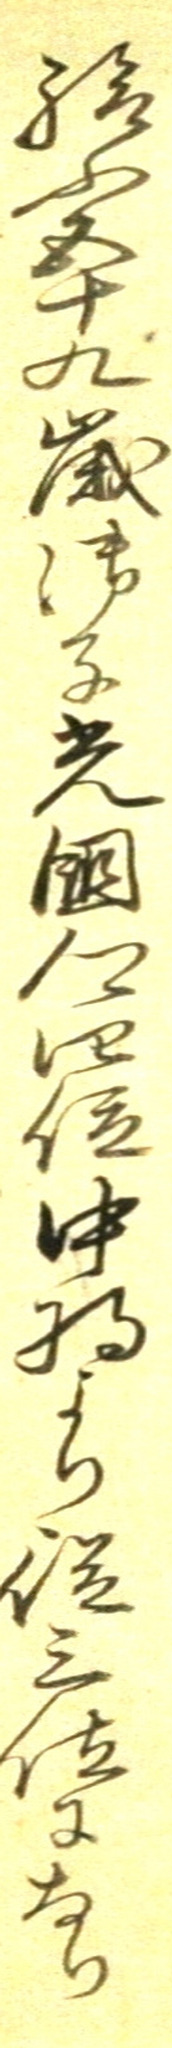給ふ五十九歳御子光国卿四位中将より従三位になり
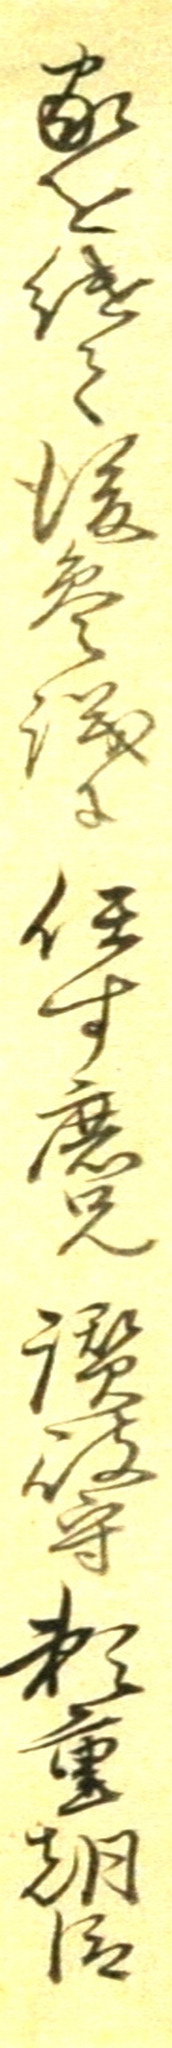家を継て後参議に任す庶兄讃岐守頼重朝臣
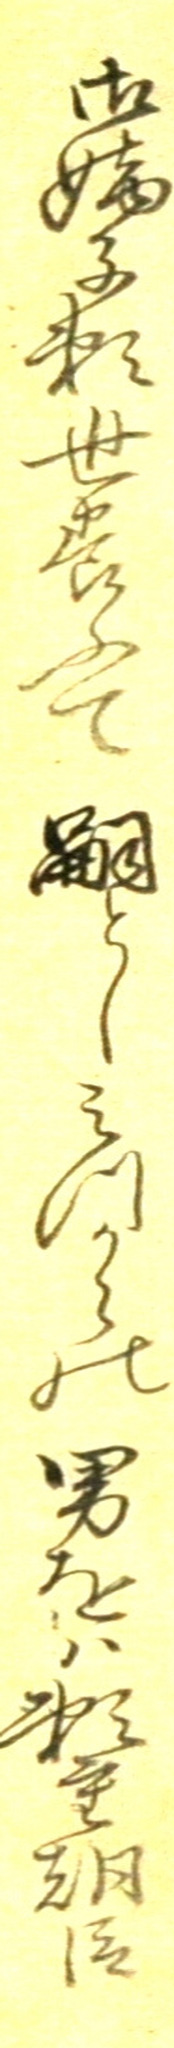御嫡子頼世養ふて嗣としみつからの男をは頼重朝臣

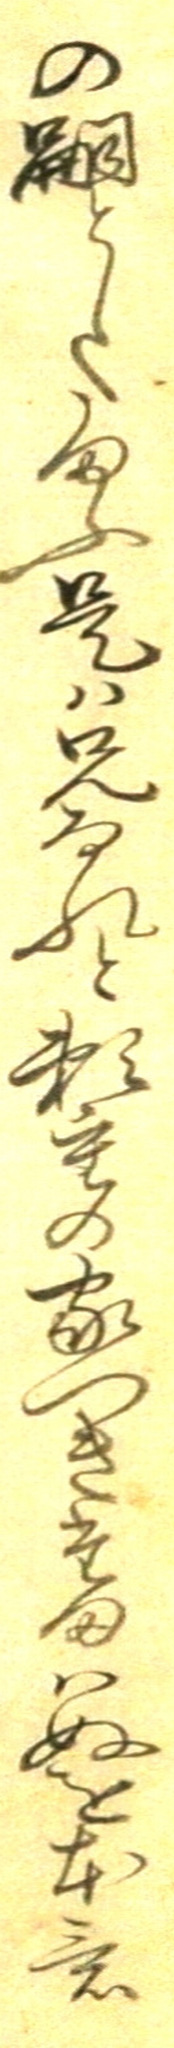の嗣としたまふ是は兄なれと頼重の家つきたまはぬを本意
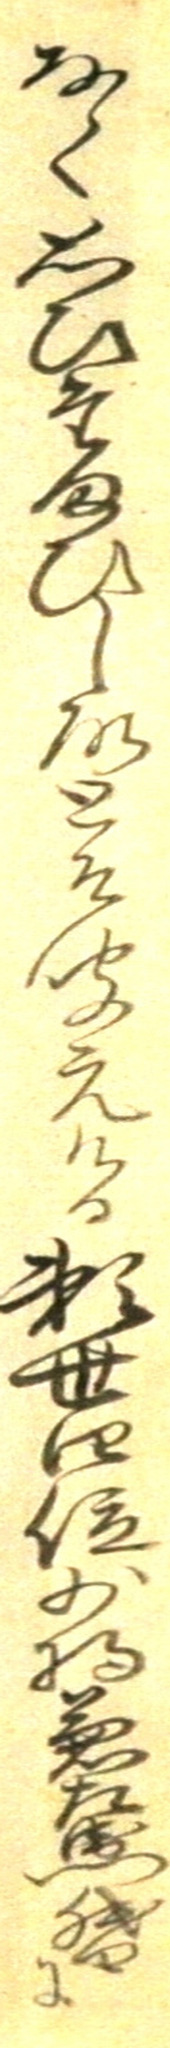なく思ひたまひし故とそ聞えける頼世四位少将兼左衛門督に
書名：藩翰譜（一）
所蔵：伊那市立高遠町図書館・合同会社AMANE
